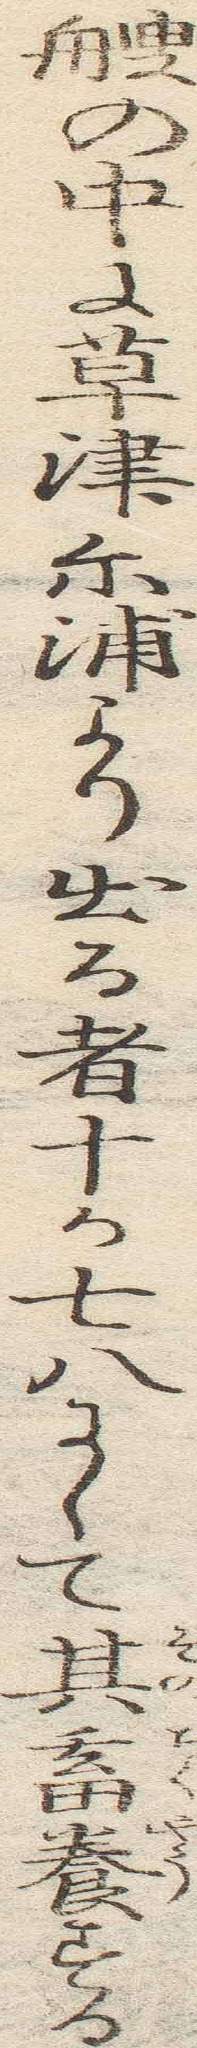艘の中に草津尓浦より出る者十か七八にして其畜養する
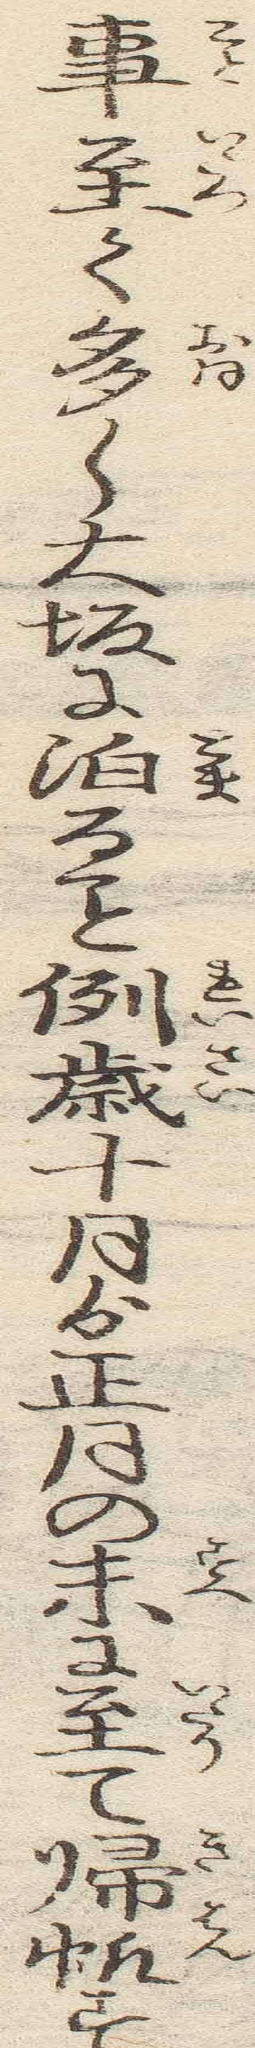事至て多し大坂に泊ること例歳十月より正月の末に至て帰帆す
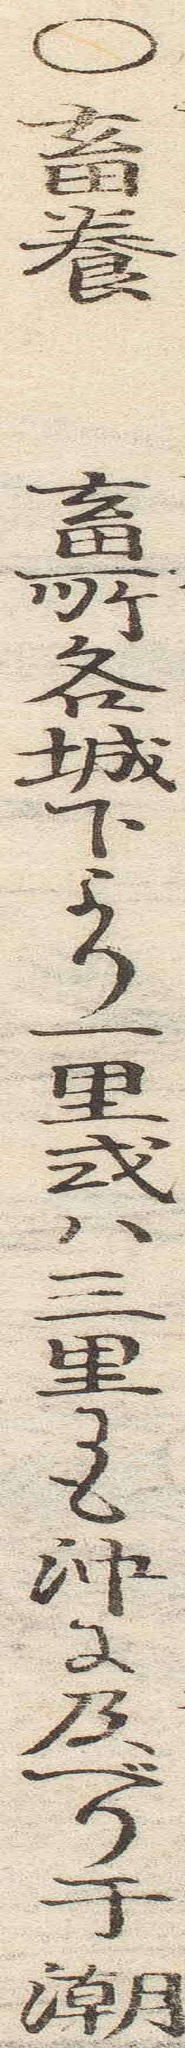○畜養畜所各城下より一里或は三里にも沖に及べり干潮
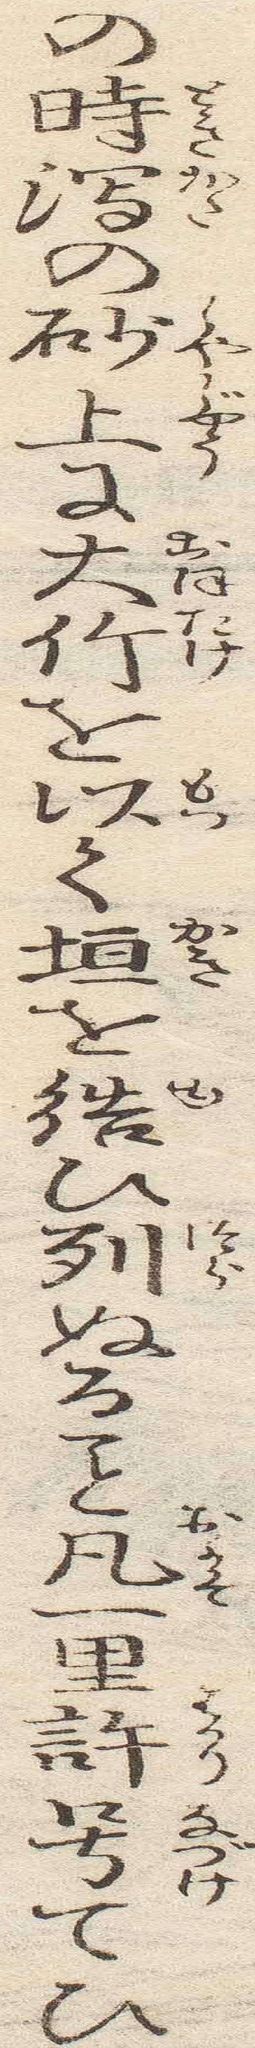の時潟の砂上に大竹を以て垣を結ひ列ぬること凡一里許号てひ
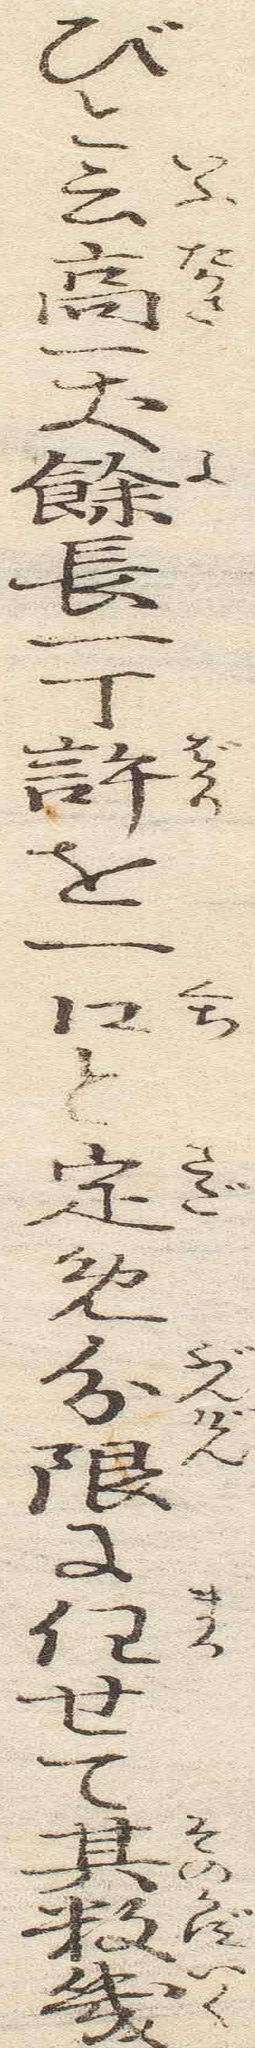びと云高一丈余長一丁許を一口と定め分限に任せて其数幾
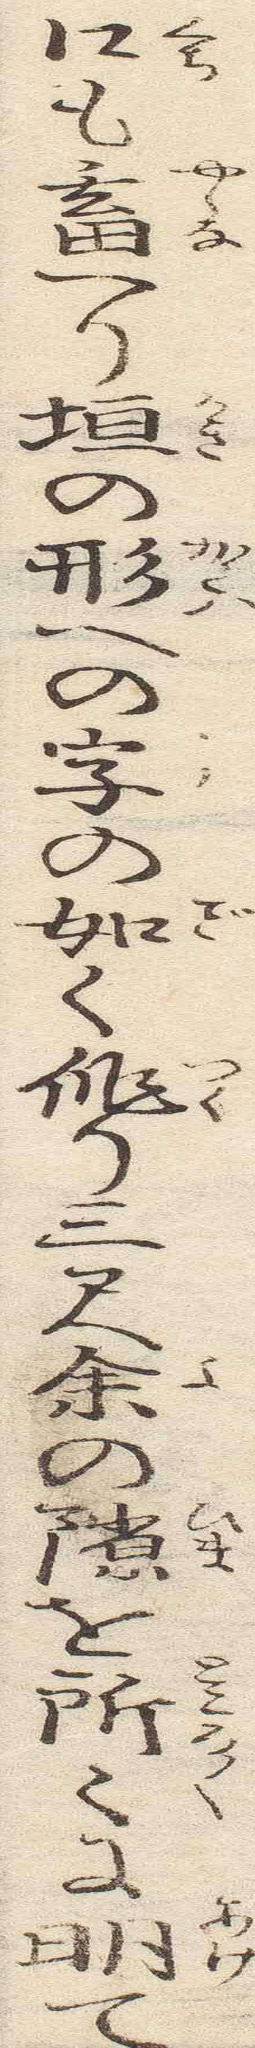口も畜へり垣の形への字の如く作り三尺余の隙を所々に明て
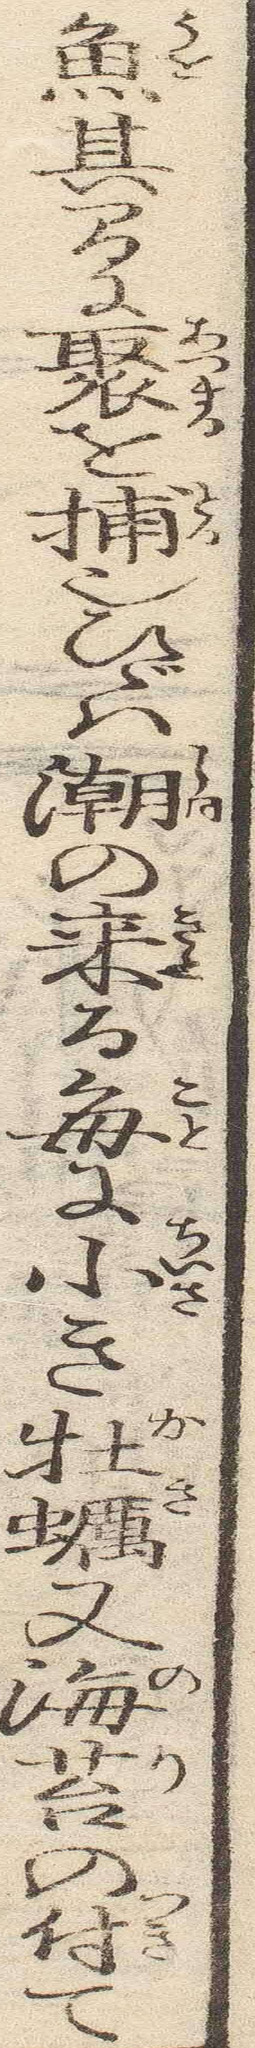魚其間に聚を捕也ひゞは潮の来る毎に小き牡蠣又海苔の付て
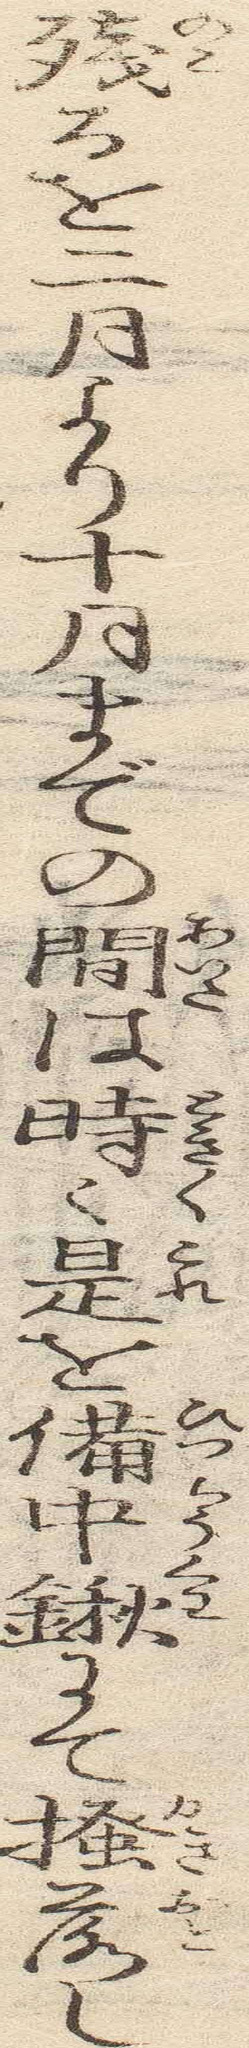残るを二月より十月までの間は時々是を備中鍬にて掻落し
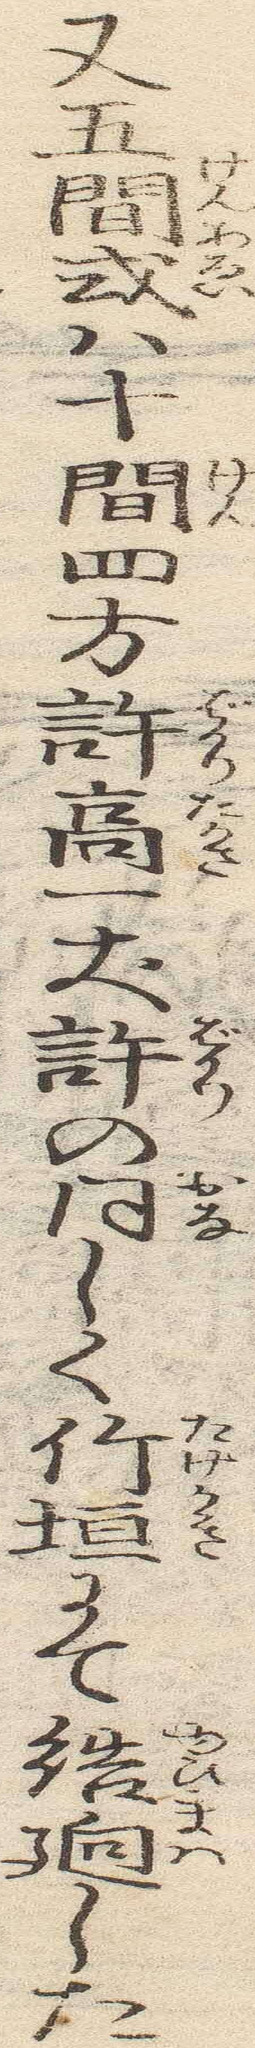又五間或は十間四方許高一丈許の同しく竹垣にて結廻した
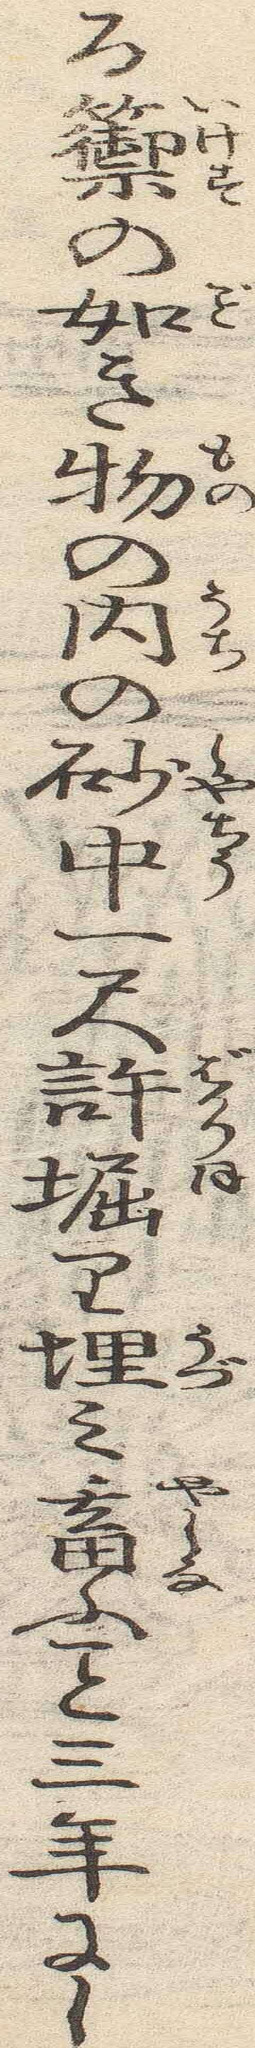る籞の如き物の内の砂中一尺許堀り埋み畜ふこと三年にし
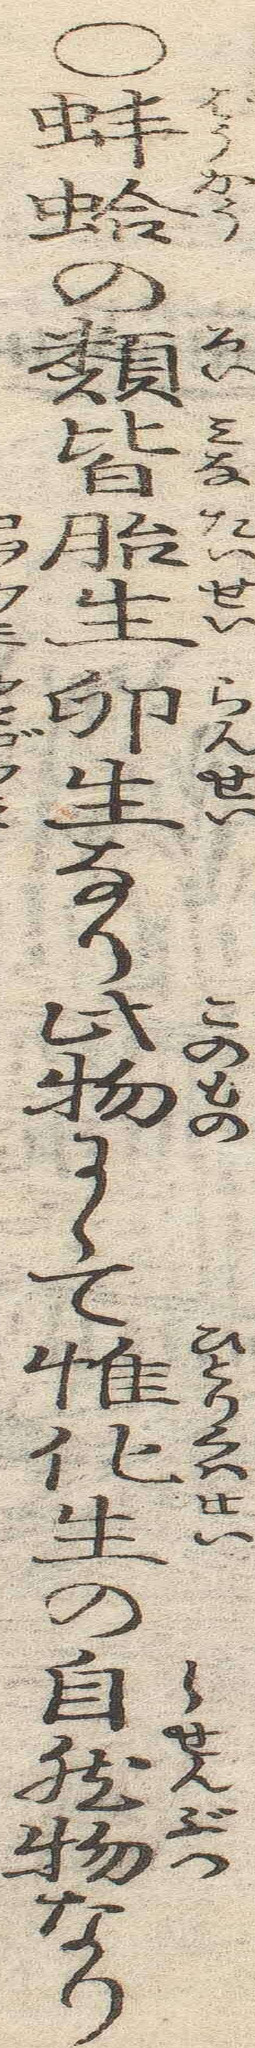○蚌蛤の類皆胎生卵生なり此物にして惟化生の自然物なり
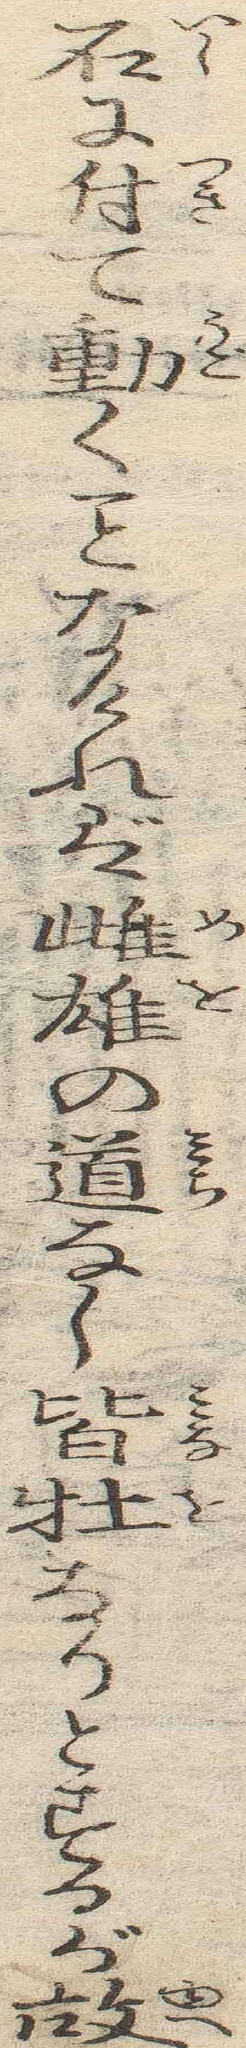石に付て動くことなければ雌雄の道なし皆牡なりとするが故
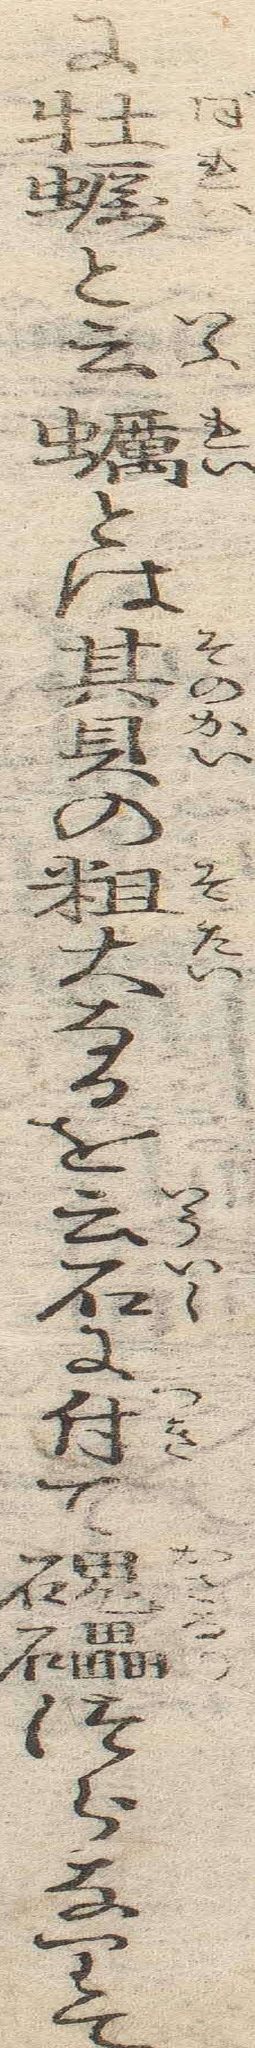に牡蠣と云蠣とは其貝の粗大なるを云石に付て磈礧つらなりて
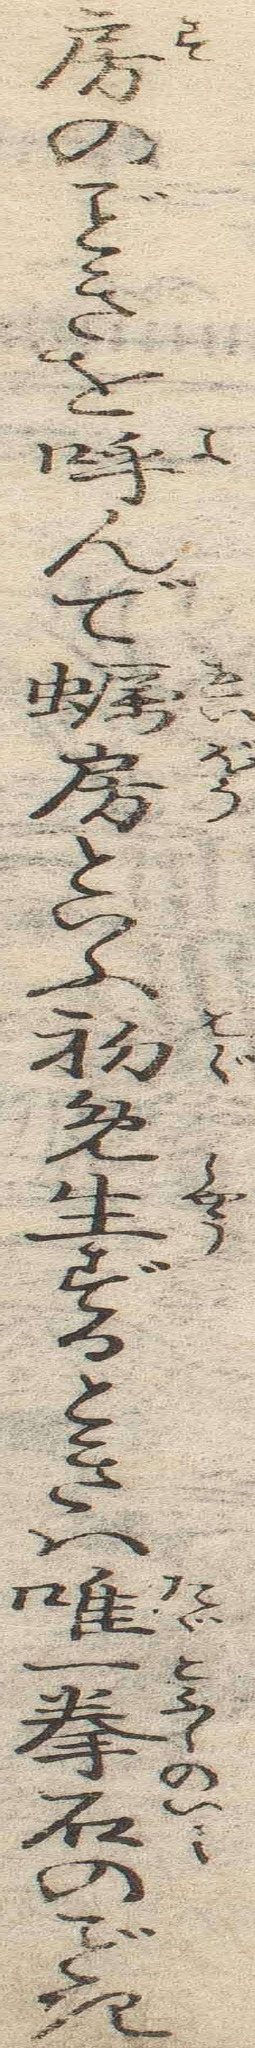房のごときを呼んで蠣房といふ初め生ずるときは唯一拳石のごとき
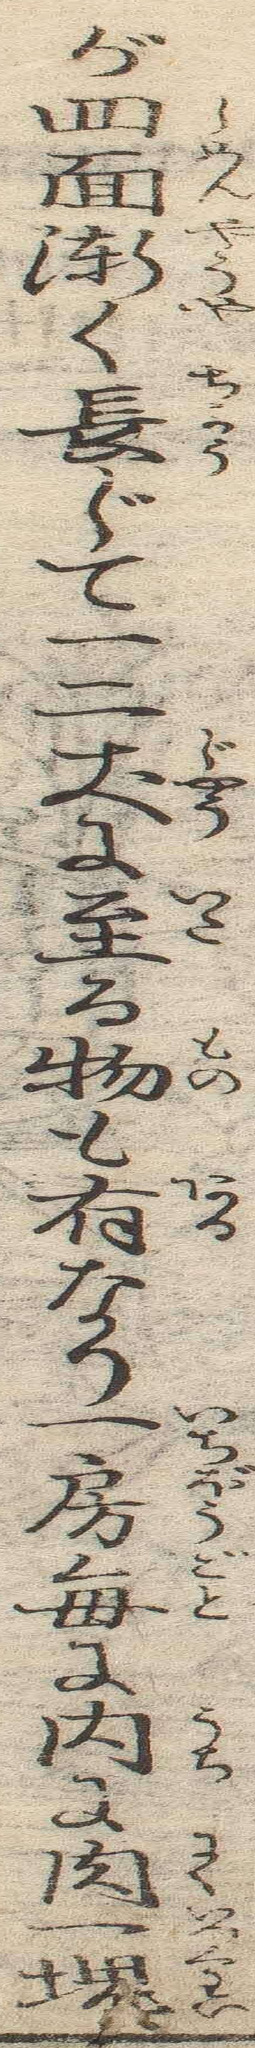が四面漸く長じて一二丈に至る物も有なり一房毎に内に肉一塊
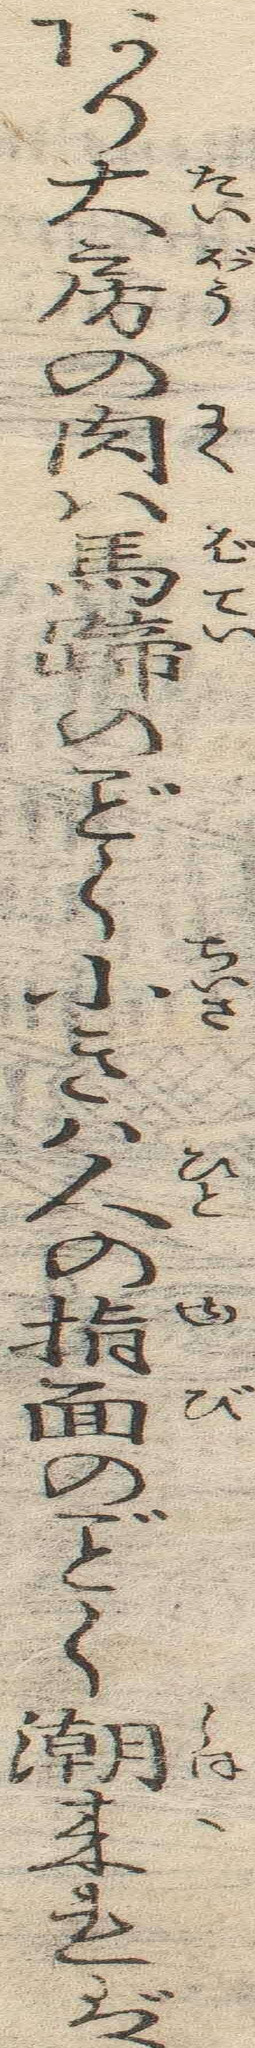あり大房の肉は馬蹄のごとし小きは人の指面のごとし潮来れば
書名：日本山海名産図会
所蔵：東京学芸大学附属図書館 国文学研究資料館
